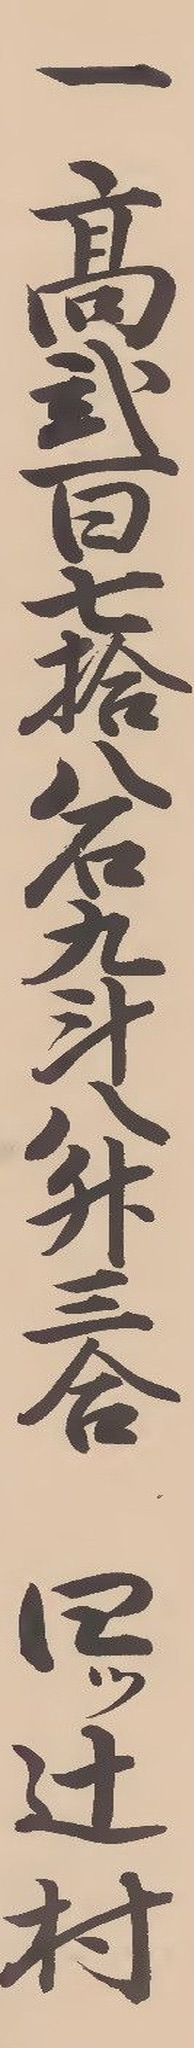一高弐百七拾八石九斗八升三合四ツ辻村
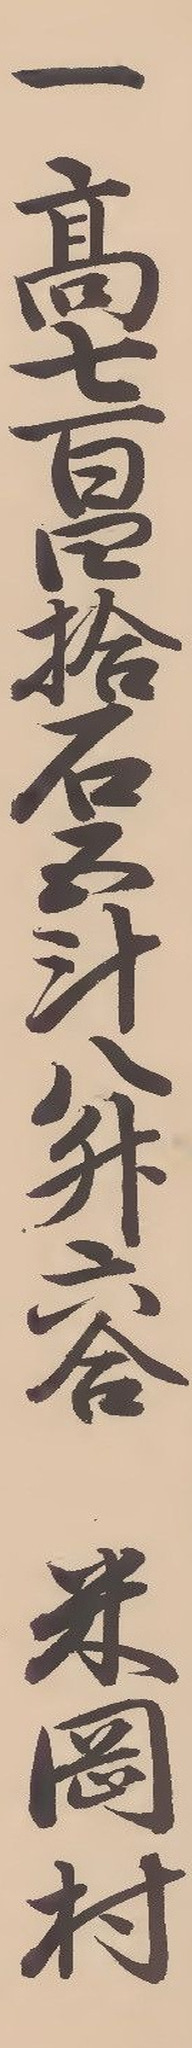一高七百四拾石五斗八升六合米岡村
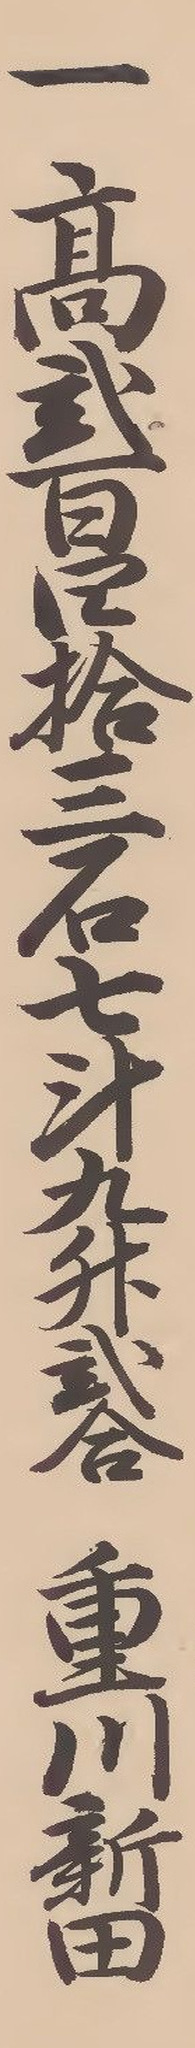一高弐百四拾三石七斗九升弐合重川新田
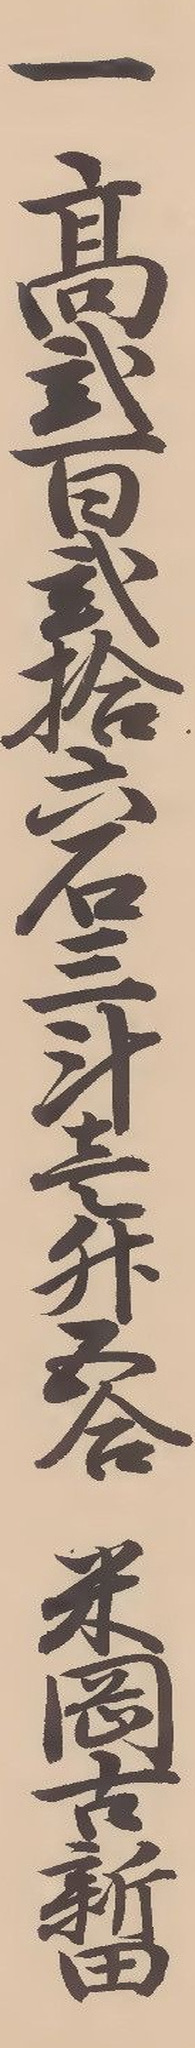一高弐百弐拾六石三斗壱升五合米岡古新田
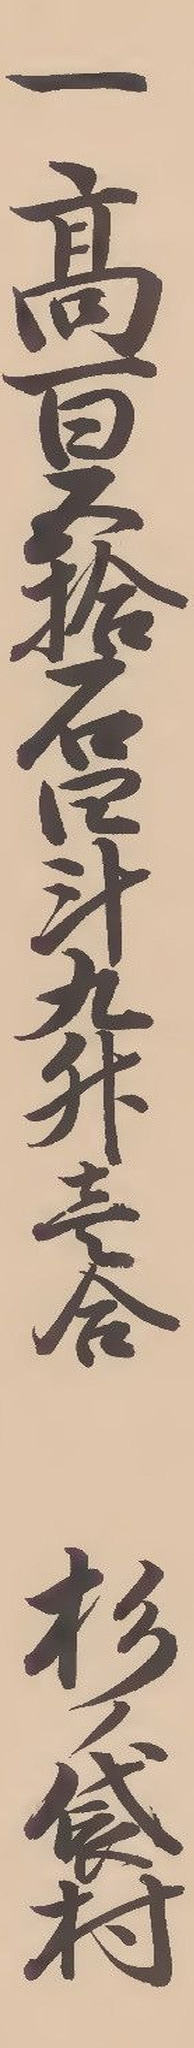一高百五拾石四斗九升壱合杉ノ袋村

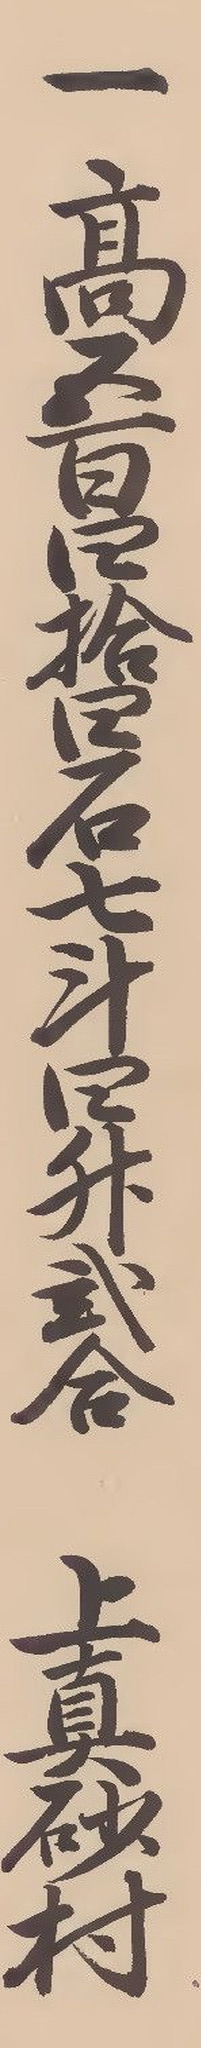一高五百四拾四石七斗四升弐合上真砂村
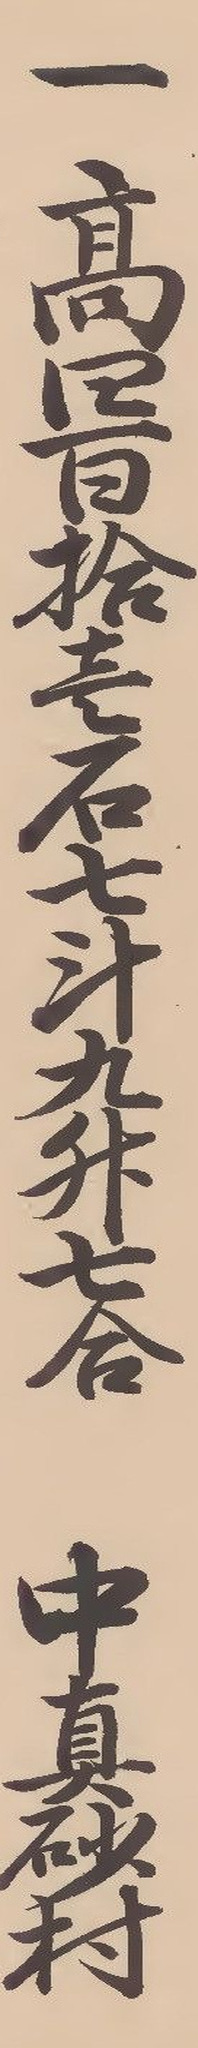一高四百拾壱石七斗九升七合中真砂村
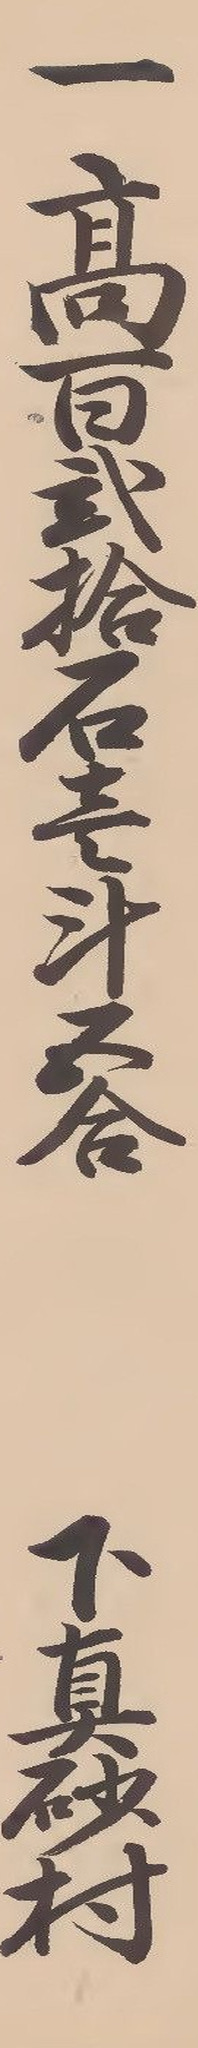一高百弐拾石壱斗五合下真砂村
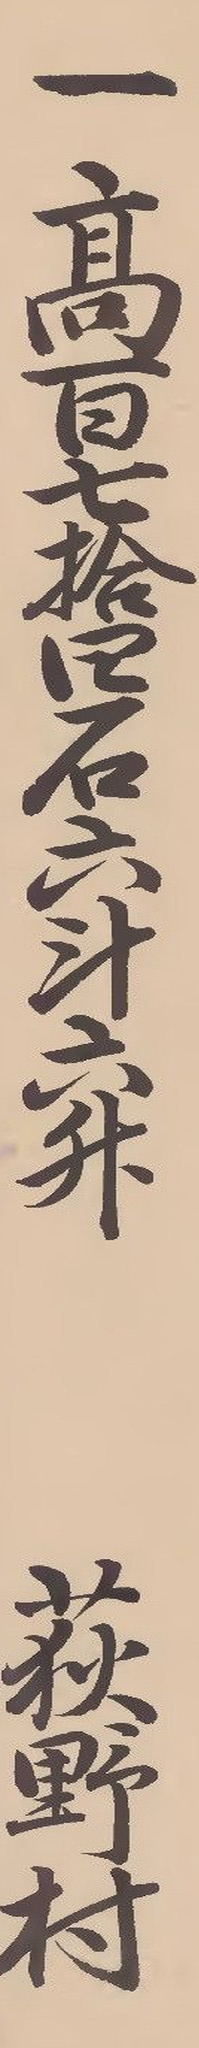一高百七拾四石六斗六升荻野村
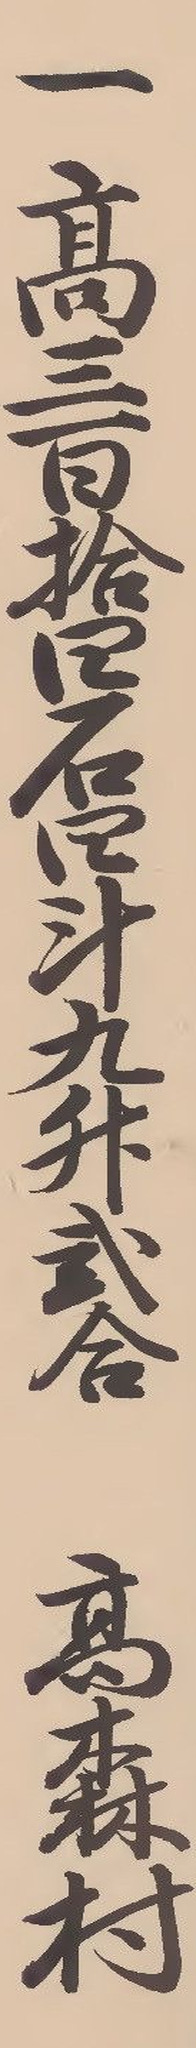一高三百拾四石四斗九升弐合高森村
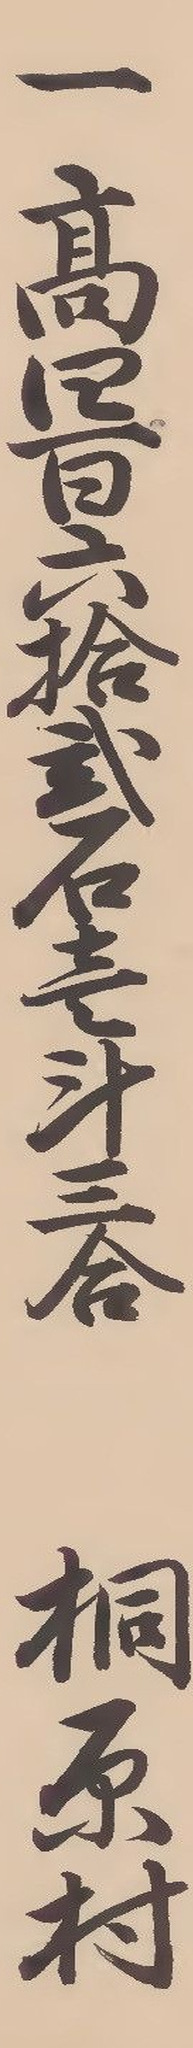一高四百六拾弐石壱斗三合桐原村
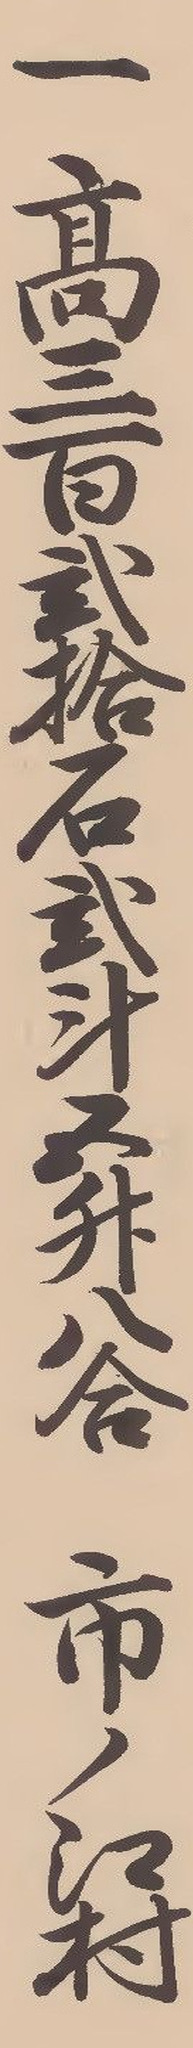一高三百弐拾石弐斗五升八合市ノ江村
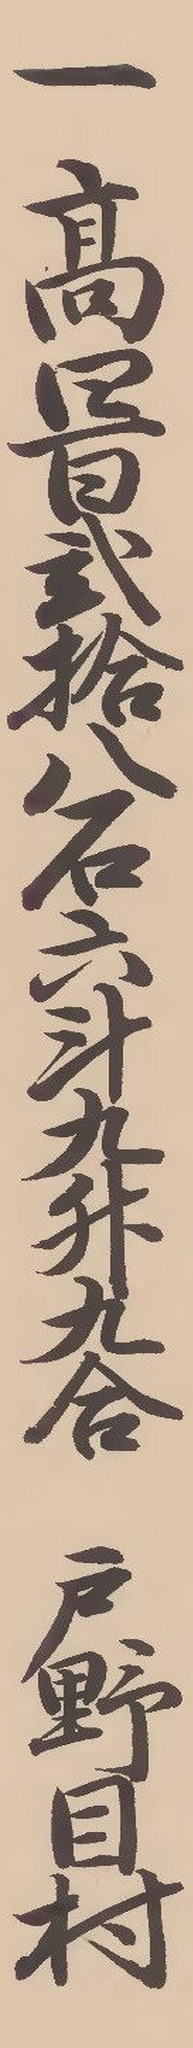一高四百弐拾八石六斗九升九合戸野目村

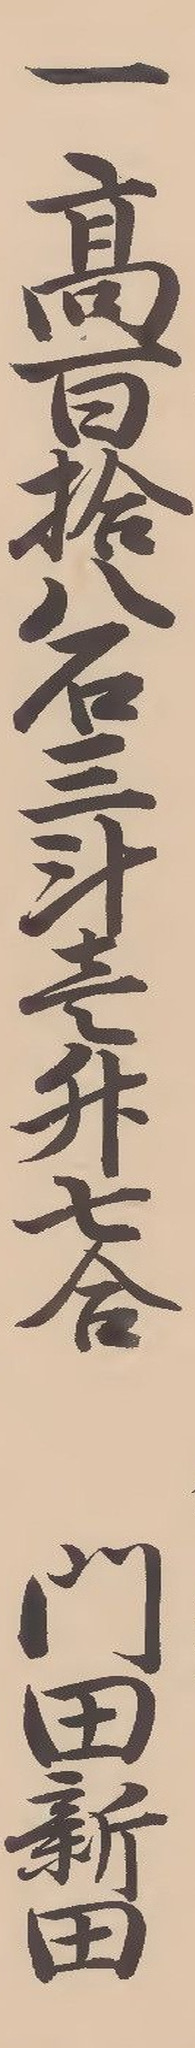一高百拾八石三斗壱升七合門田新田
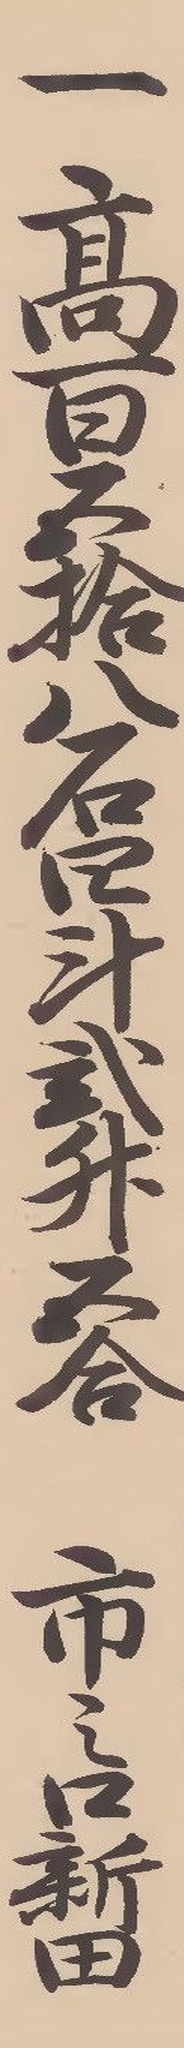一高百五拾八石四斗弐升五合市之口新田
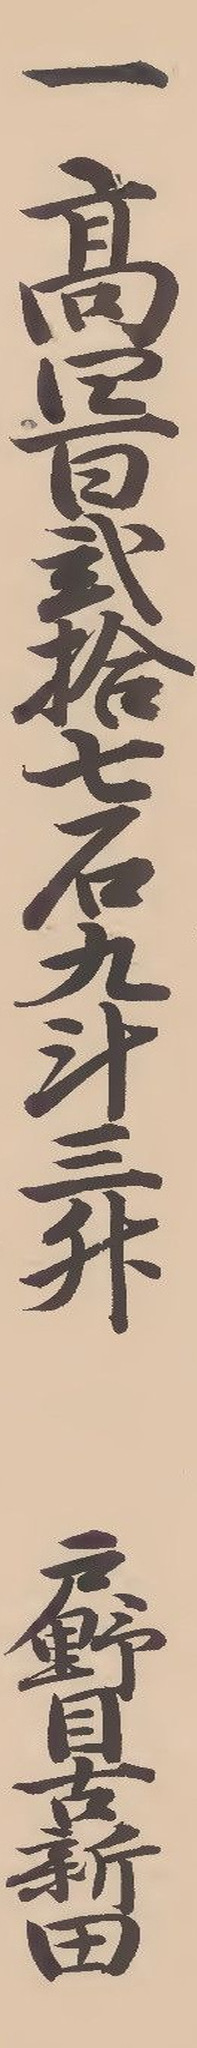一高四百弐拾七石九斗三升戸野目古新田
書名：越後国郷帳　上
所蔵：国立公文書館 National Archives of Japan
